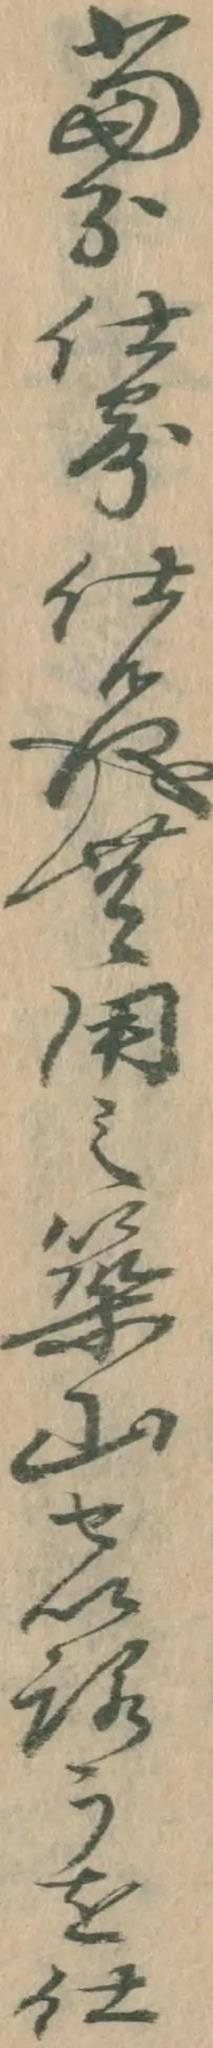当分仕寄仕候儀無用之築山せ以路うを仕
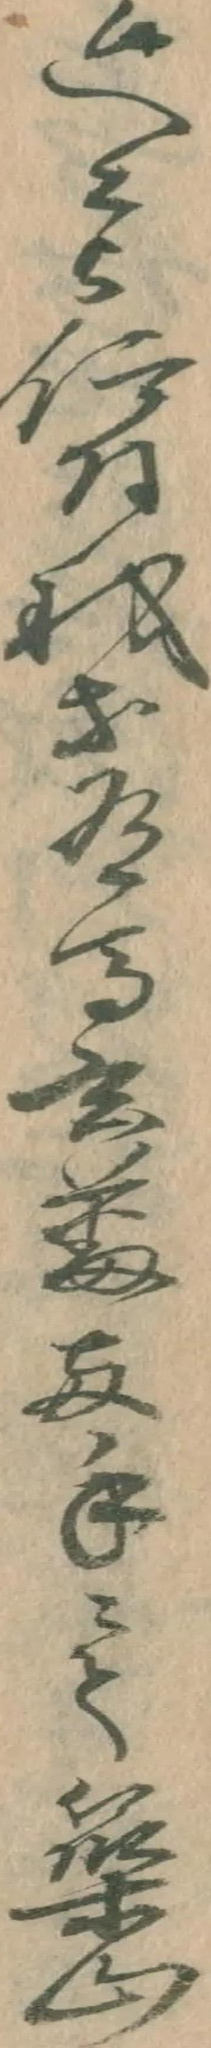候へと被仰付我等有馬玄蕃両手にて築山

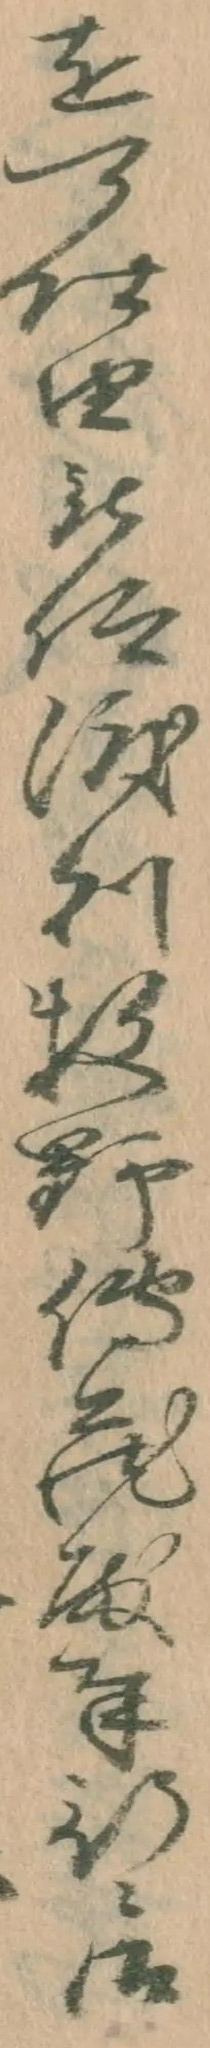を可仕由被仰渡則牧野伝蔵殿奉行に御
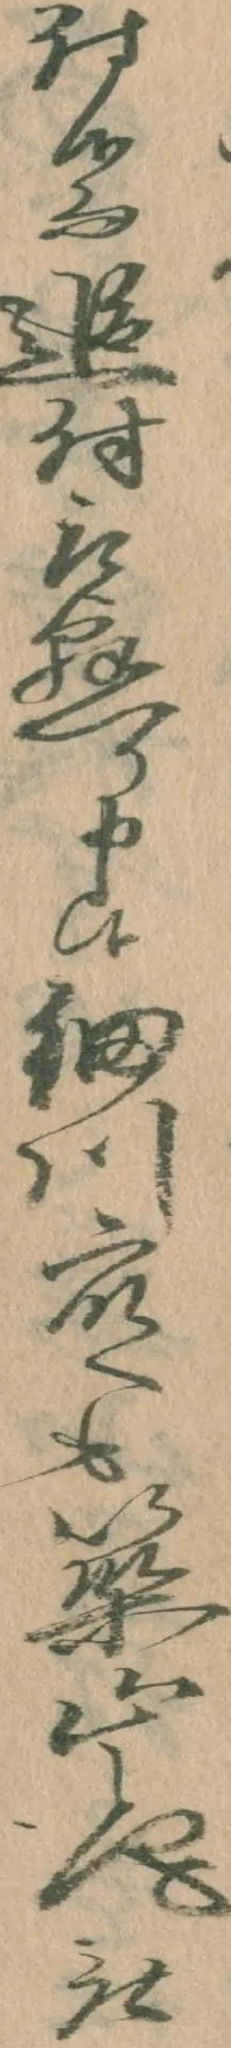付候而追付取懸り申候細川衆へも築山之儀被
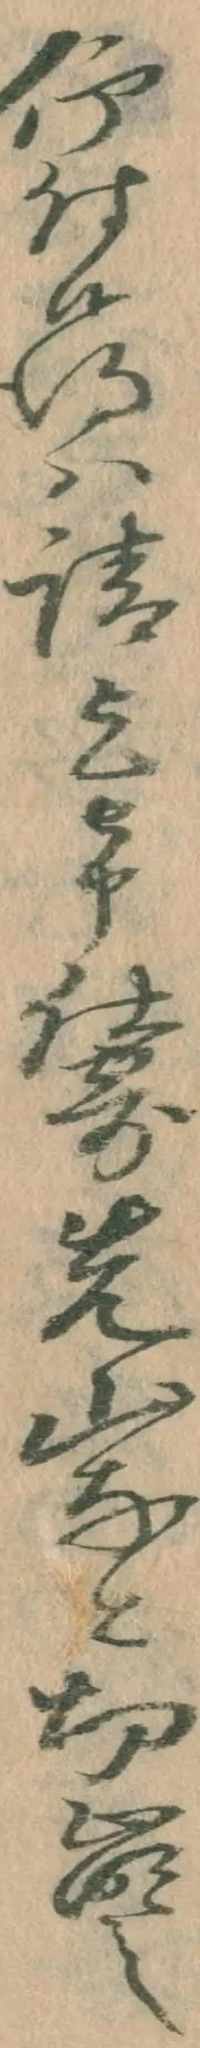仰付候得は請乞被申仕寄先山なと切崩し
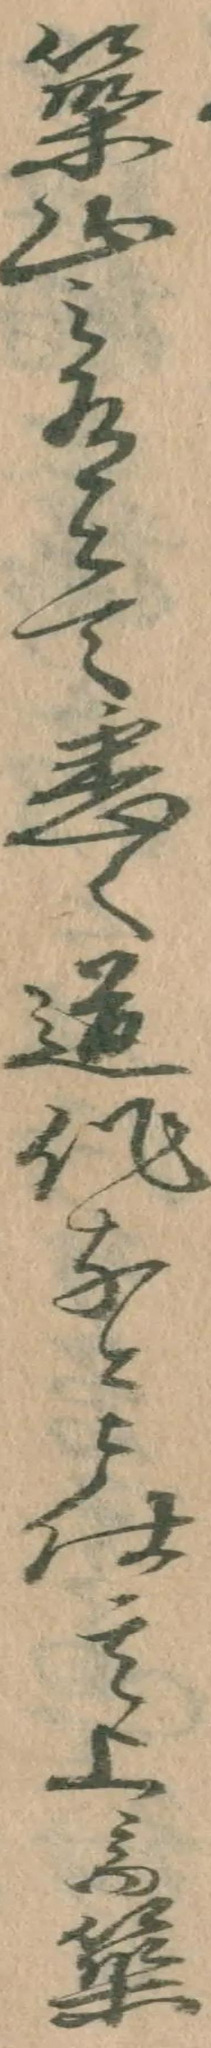築山之有とて悉く道作なと被仕其上に而築
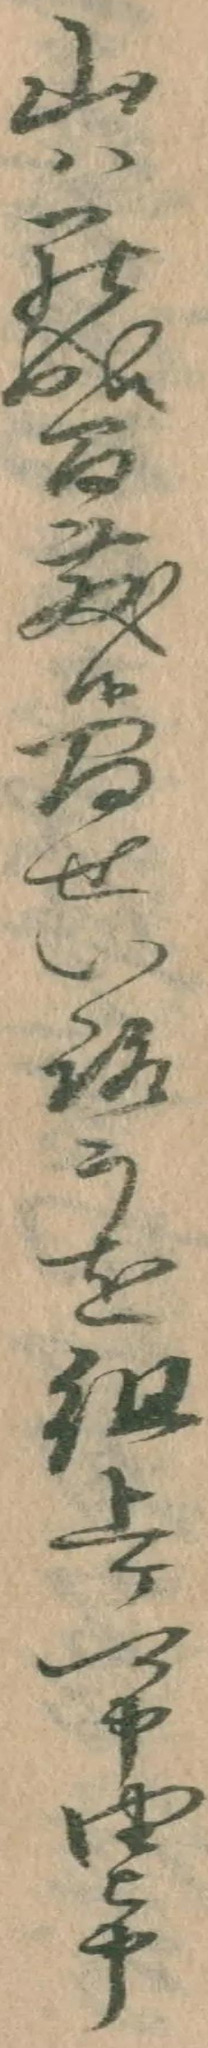山は罷成間敷候間せい路うを組上け可申由被申
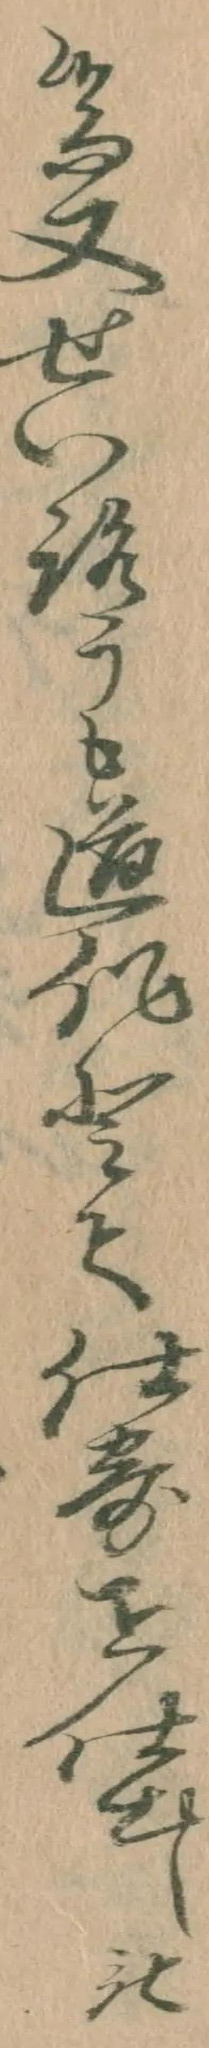候而又せい路うも道作登て仕寄を仕出し被
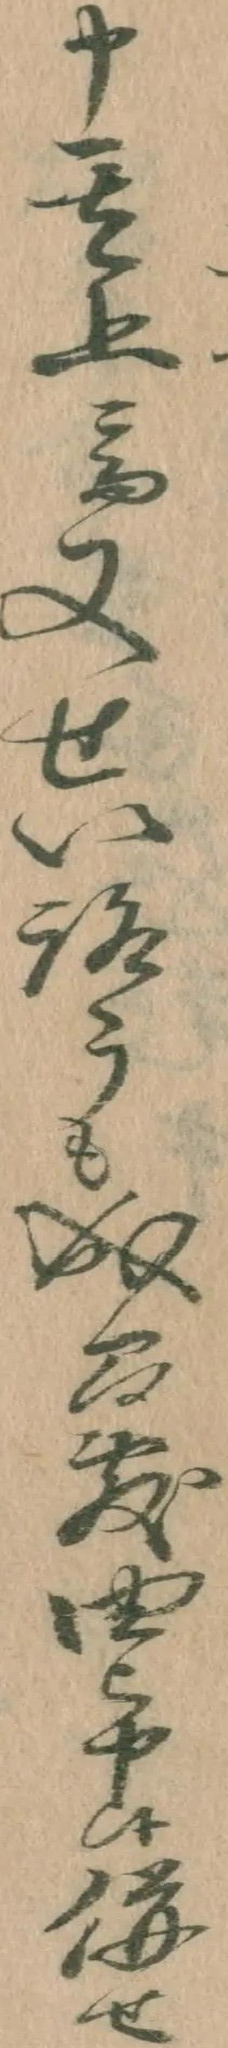申其上に而又せい路うも成間敷由被申候併せ
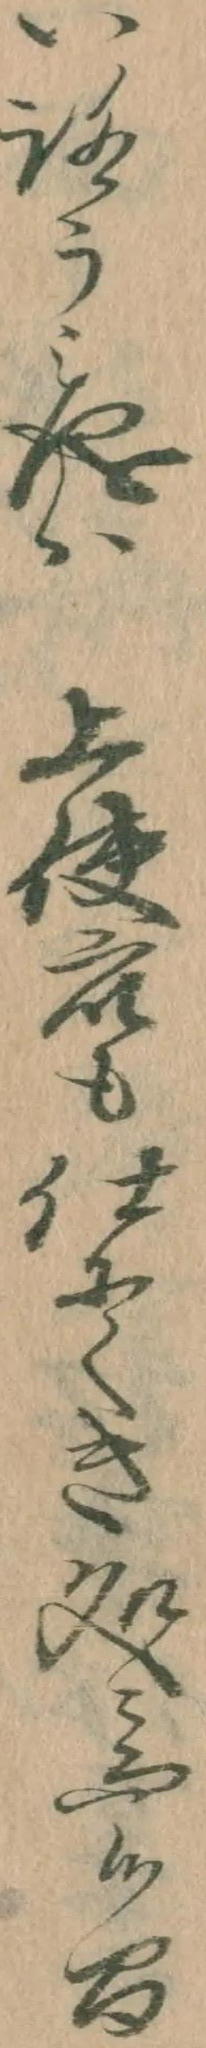い路う之儀は上使衆も仕尓くき処に而候間
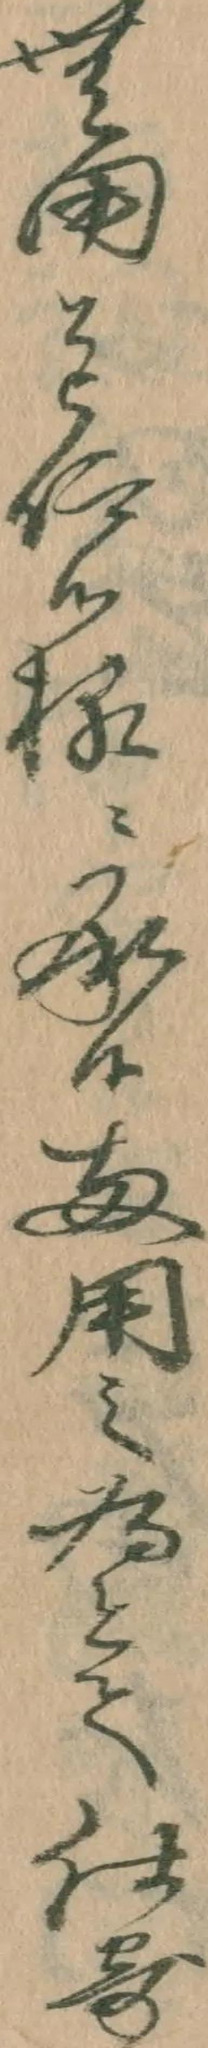無用と被仰候様に承候両用之為とて仕寄
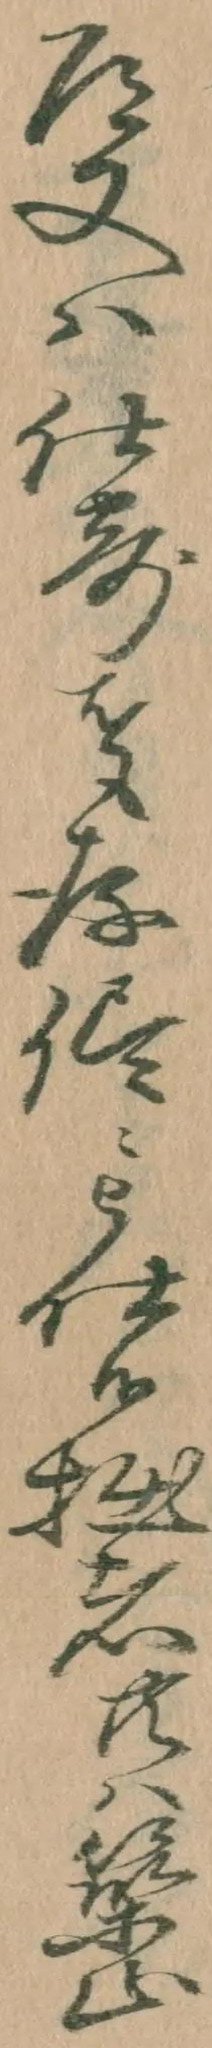道又は仕寄をも存侭に被仕候拙者共は築山
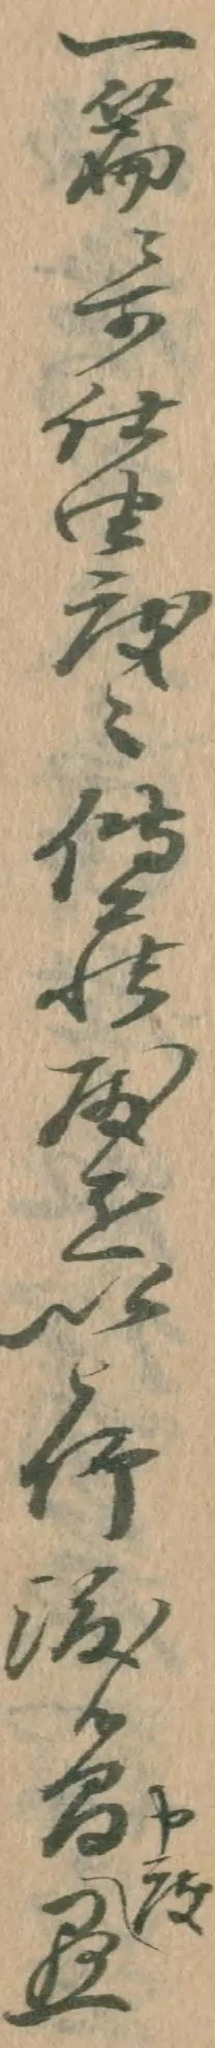一篇に可仕由度々伝蔵殿を以仰渡候間申度懸
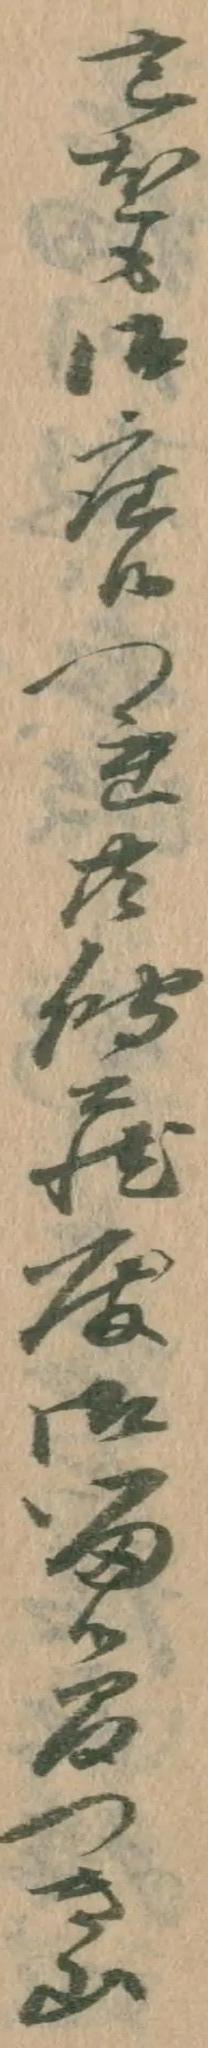意をも御座候つ連共伝蔵殿御留候間つき山
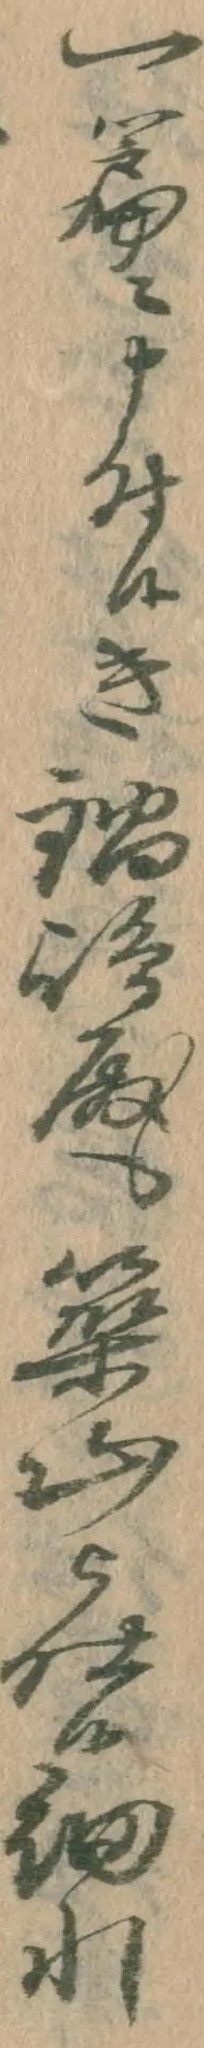一篇に申付候き鍋島殿も築山被仕候細川
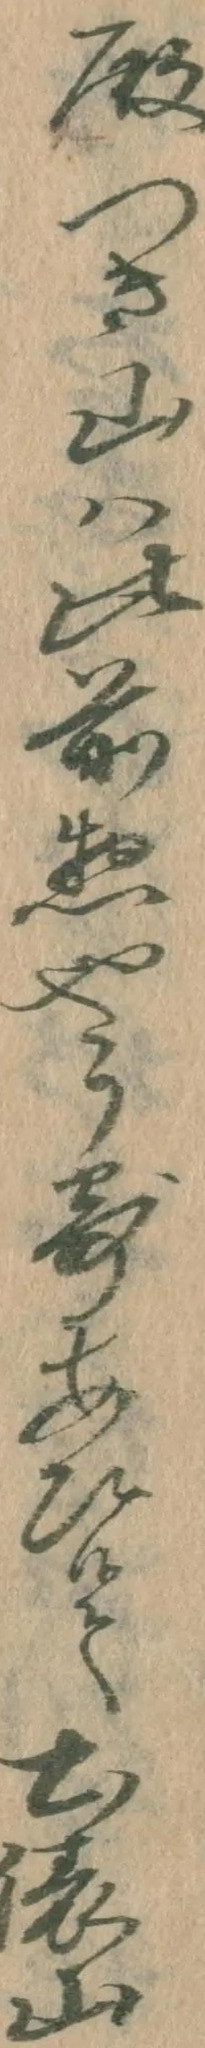殿つき山は此前惣やう寄あひ候て土俵山
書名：切支丹御退治記 49巻. [5]
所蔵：国立国会図書館 National Diet Library, JAPAN
